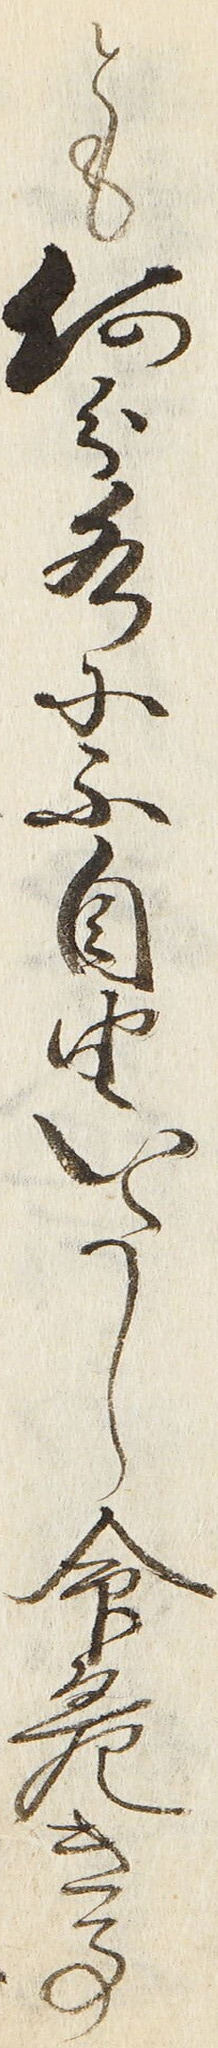とも何分水にふ自由いたし命危き事
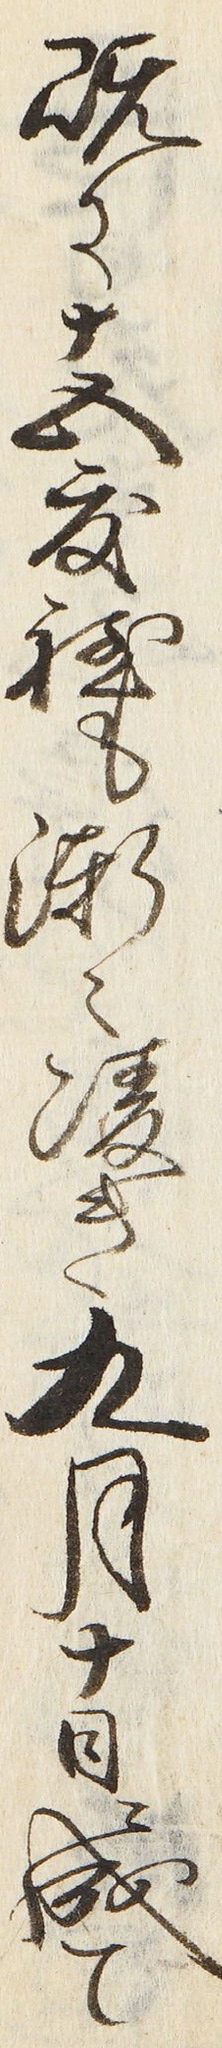既に十五度程も漸々凌き九月十日に成て
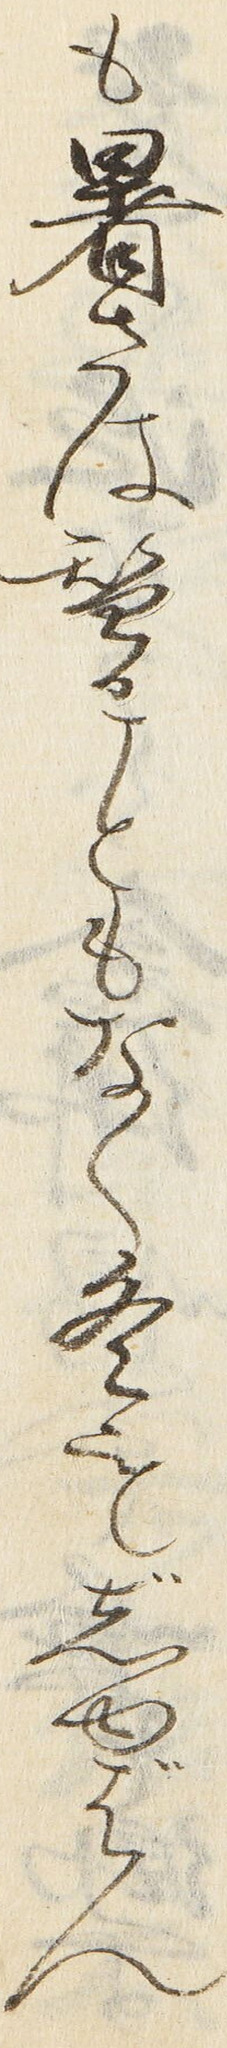も暑さは替ることもなく冬もじゆばん
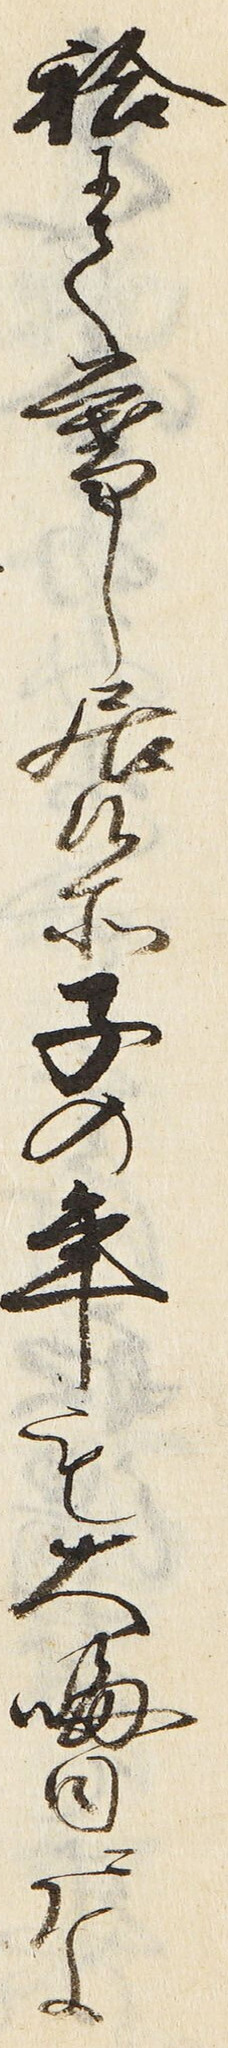袷にて暮し居候所子の年も大晦日にな
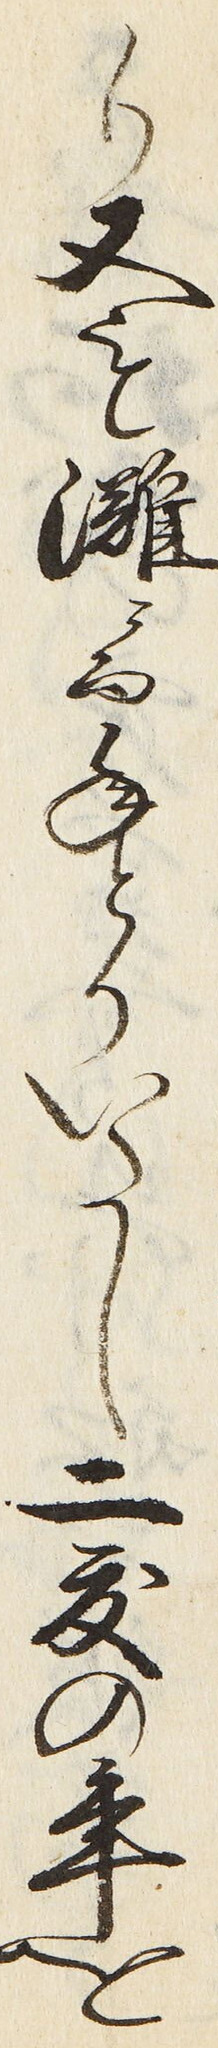り又も灘にて年とりいたし二度の年を
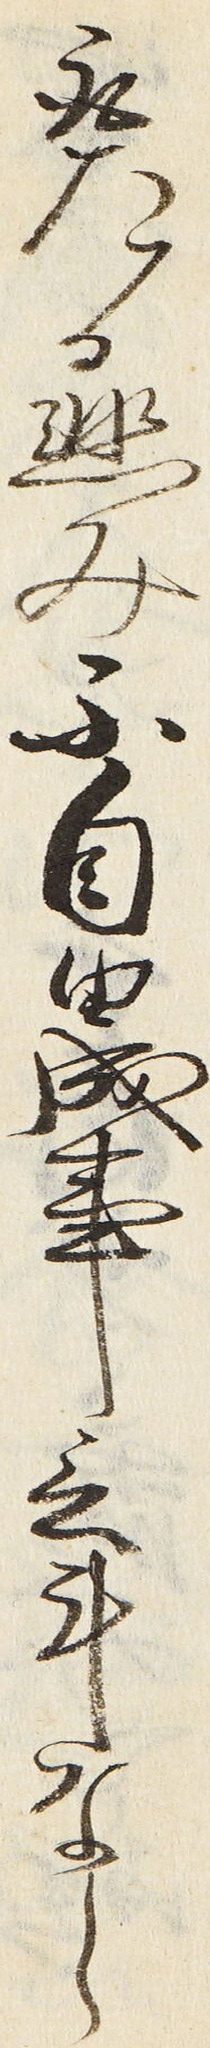取たる悲みふ自由成事云事なし
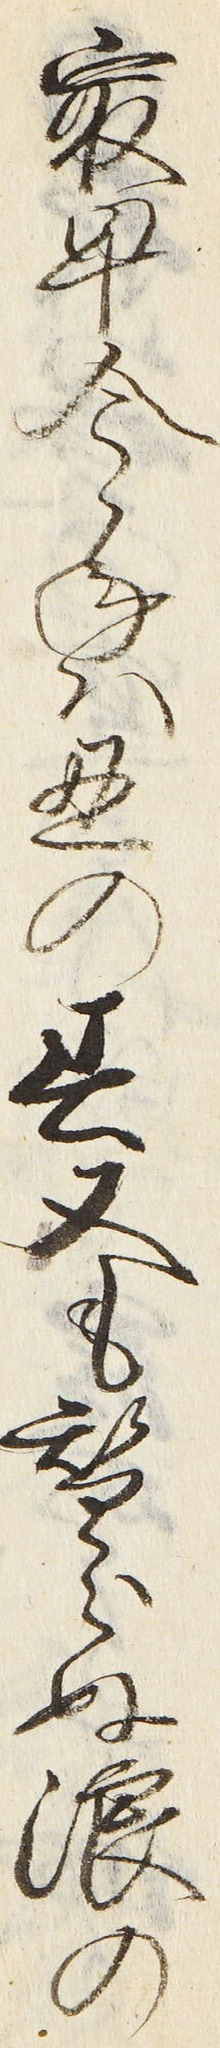最早今年は丑の春又も替らぬ浪の
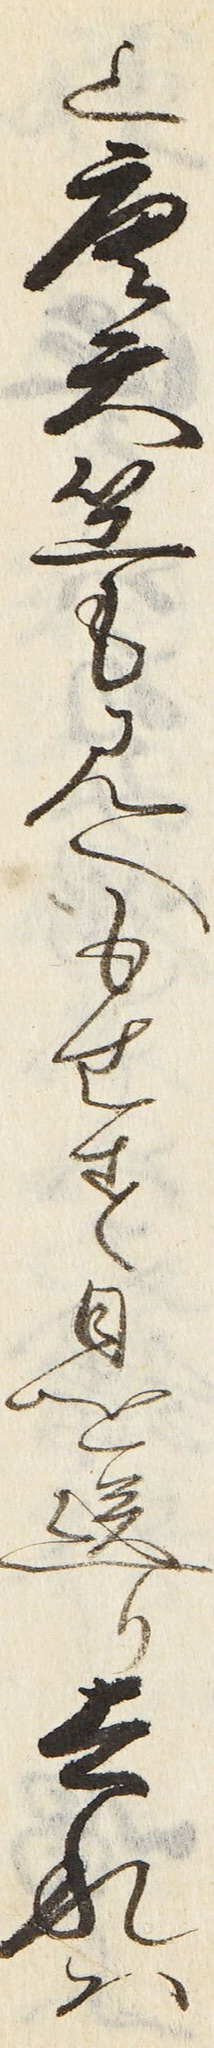上唐天竺も見へもせす日を送り去れは
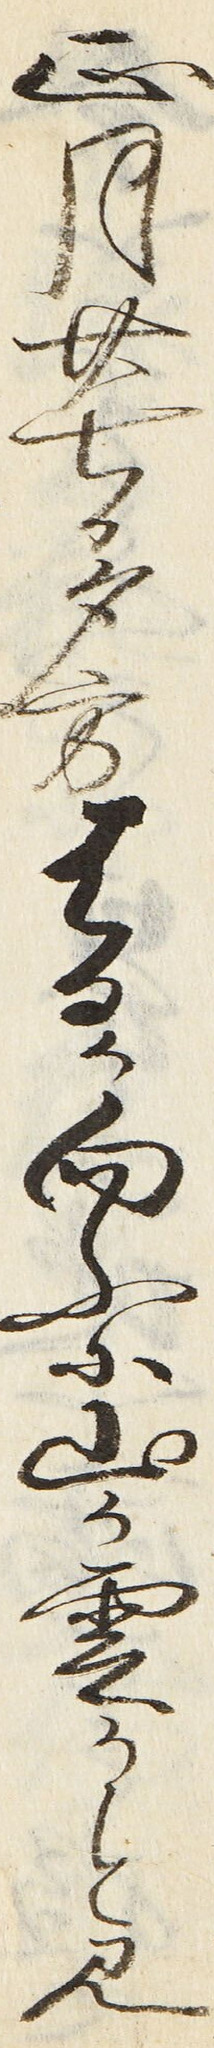正月廿七日夕方はるか向ふに山か雲かと見
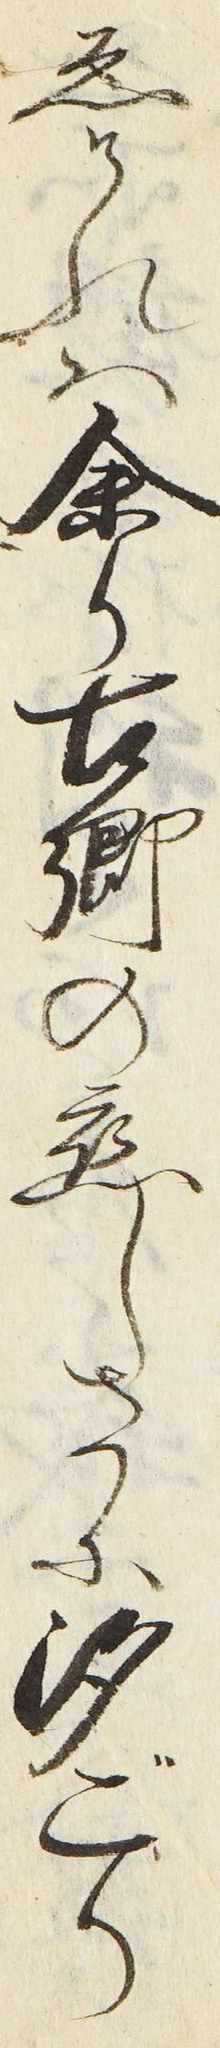ゑけれは余り古郷の恋しさに汐ごり
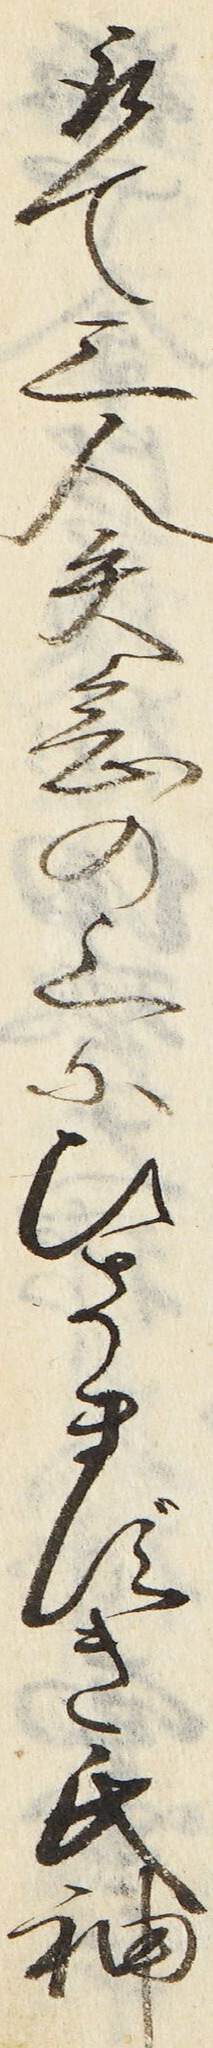取て三人失念の上にひさまずき氏神

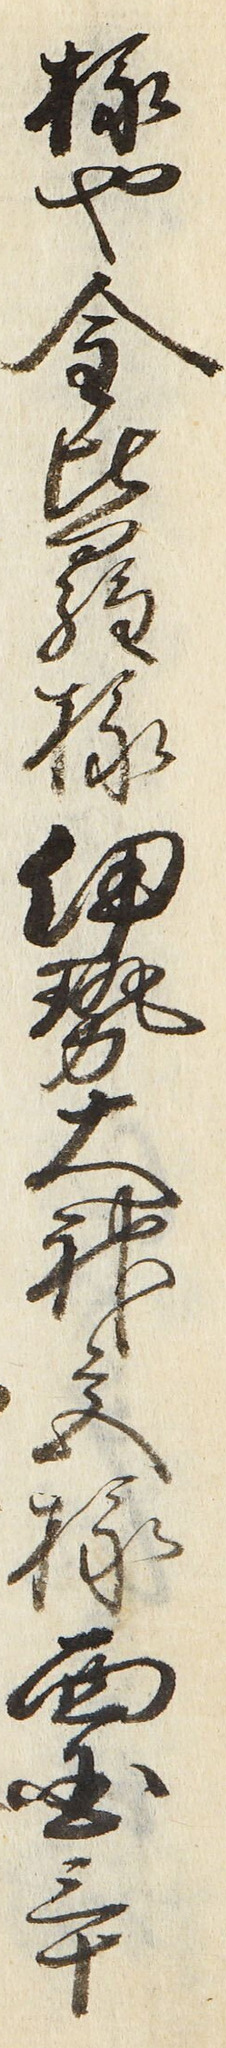様や金毘羅様伊勢大神宮西国三十
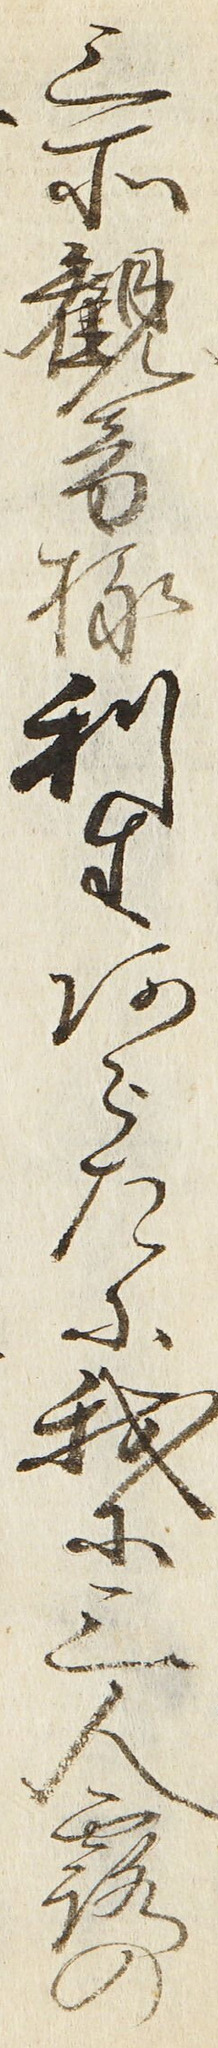三所観音様利生あらたに我等三人露の
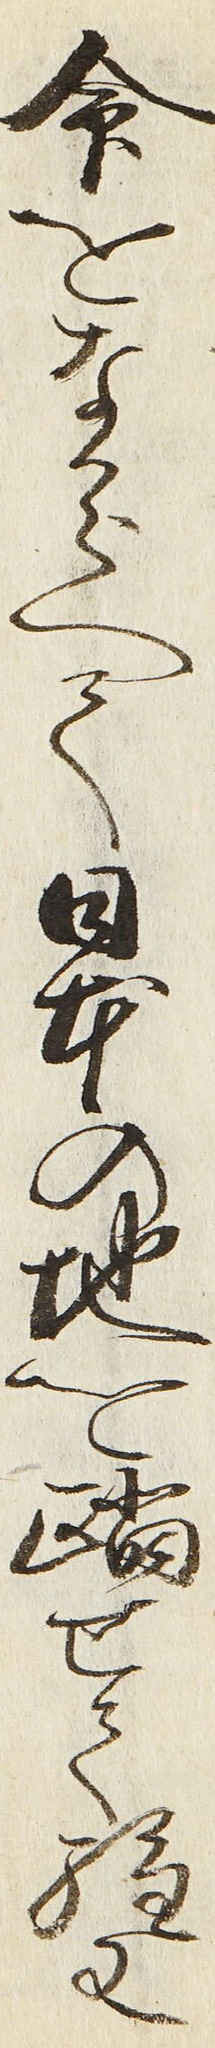命をなからへて日本の地を踏せて
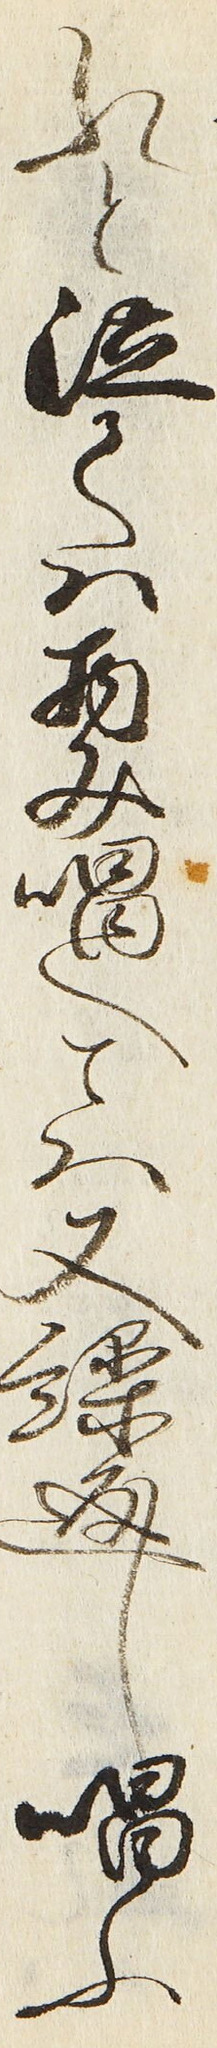ふと泣ては拝み唱へては又繰返し唱ふ
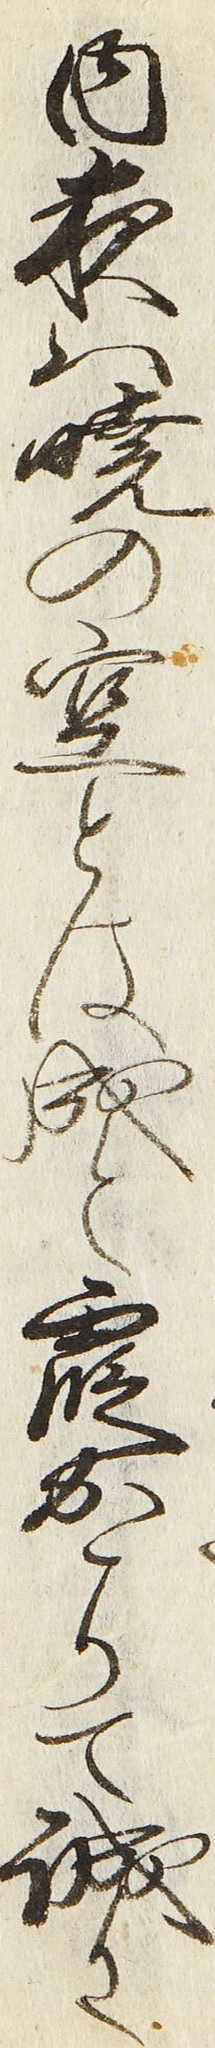内夜は暁の空とは成て霞かゝりて誠に
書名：天保漂流記
